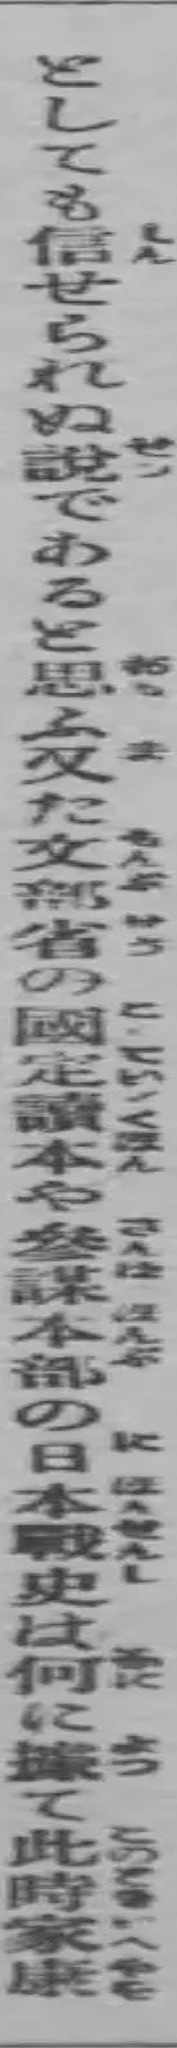としても信ぜられぬ説であると思ふ又た文部省の国定読本や参謀本部の日本戦史は何に拠て此時家康
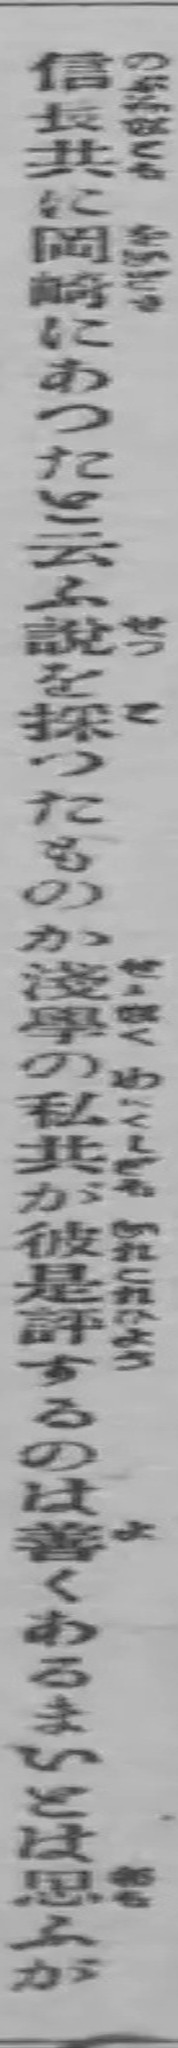信長共に岡崎にあつたと云ふ説を採つたものか浅学の私共が彼是評するのは善くあるまいと思ふが
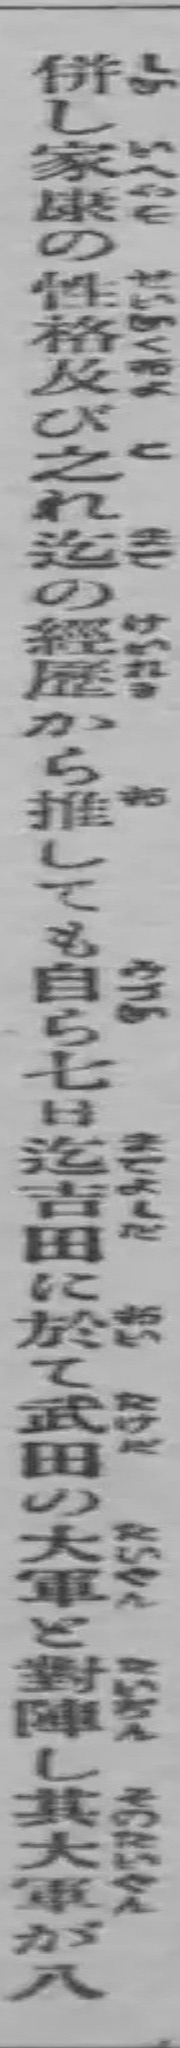併し家康の性格及び之れ迄の経歴から推しても自ら七日迄吉田に於て武田の大軍と対陣し其大軍が八
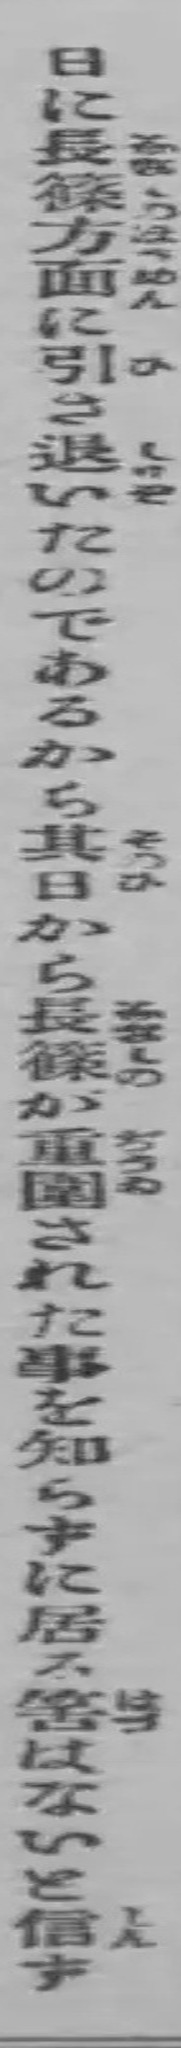日に長篠方面に引き退いたのであるから其日から長篠が重囲された事を知らずに居る筈はないと信ず
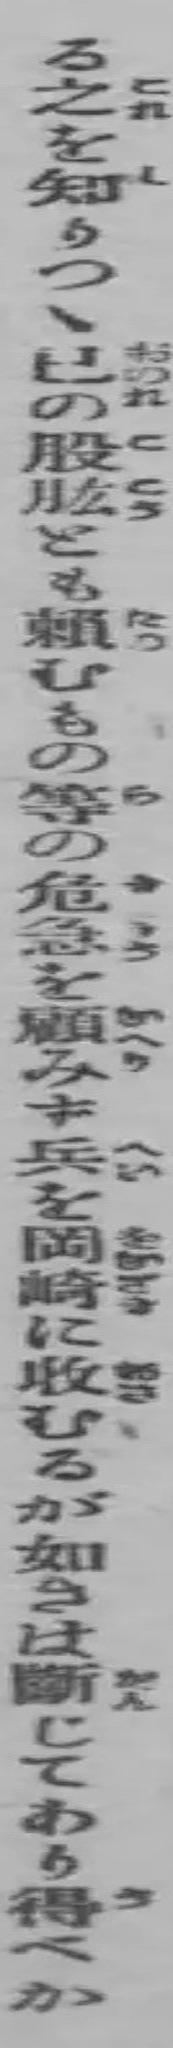る之を知りつゝ巳の股肱とも頼むもの等の危急を顧みず兵を岡崎に収むるが如きは断じてあり得べか
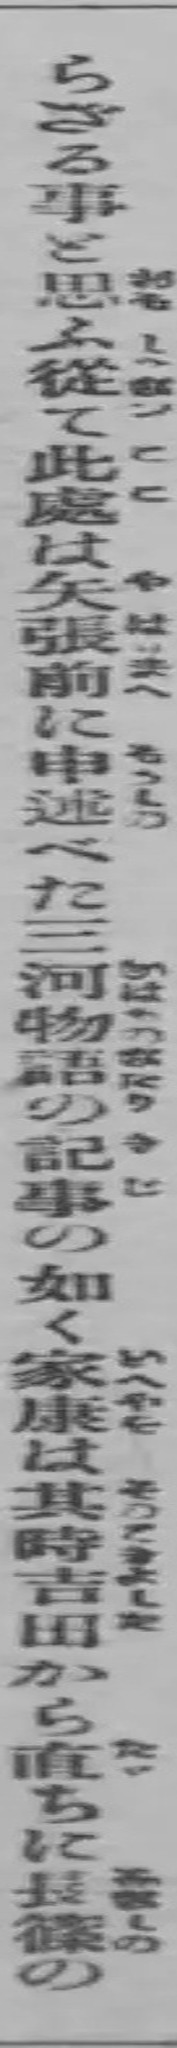らざる事と思ふ従て此処は矢張前に申述べた三河物語の記事の如く家康は其時吉田から直ちに長篠の
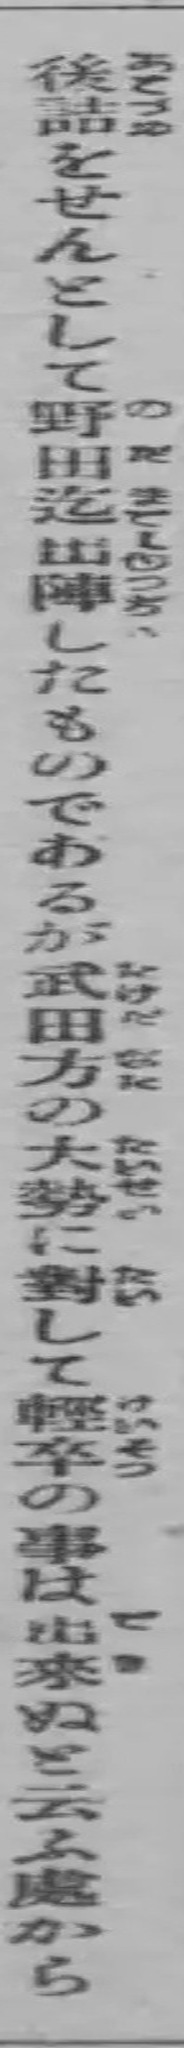後詰をせんとして野田迄出陣したものであるが武田方の大勢に対して軽率の事は出来ぬと云ふ処から
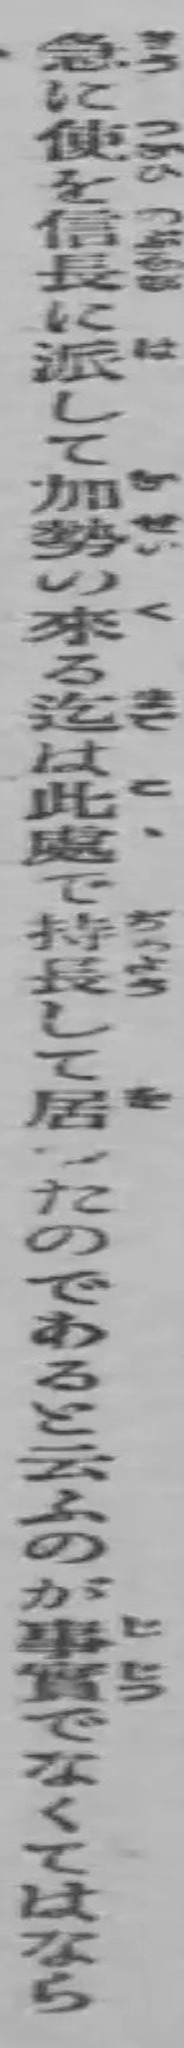急に使を信長に派して加勢の来る迄は此処で持長して居つたのであると云ふのが事実でなくてはなら
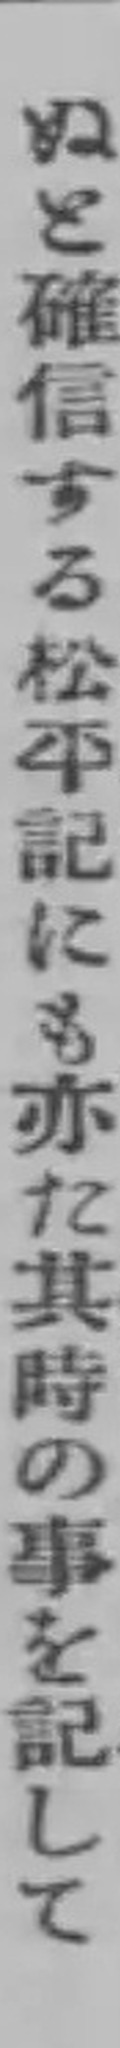ぬと確信する松平記にも亦た其時の事を記して
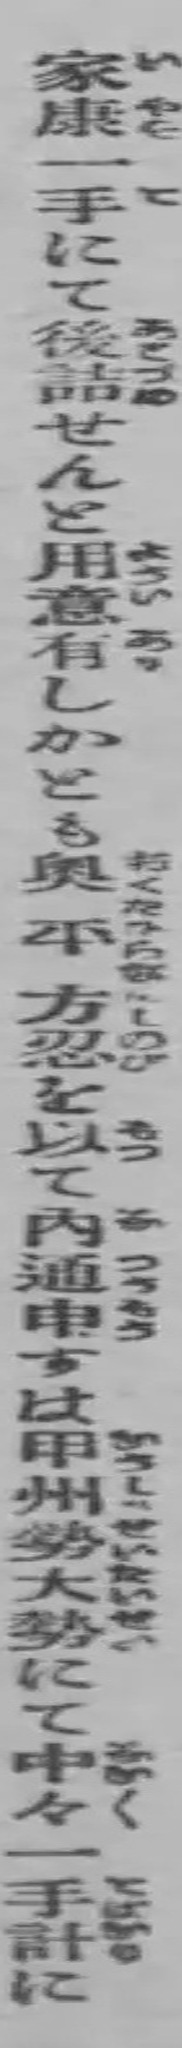家康一手にて後詰せんと用意有しかとも奥平方忍を以て内通申すは甲州勢大勢にて中々一手計に
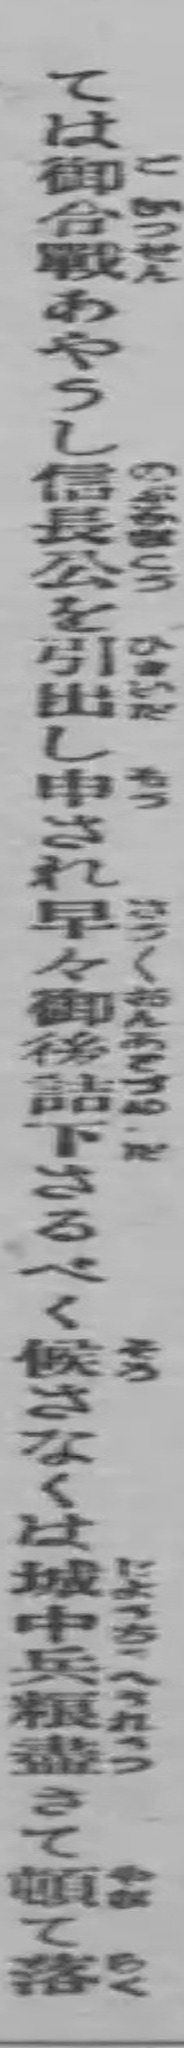ては御合戦あやうし信長公を引出し申され早々御後詰下さるべく候さなくは城中兵糧尽きて頓て落
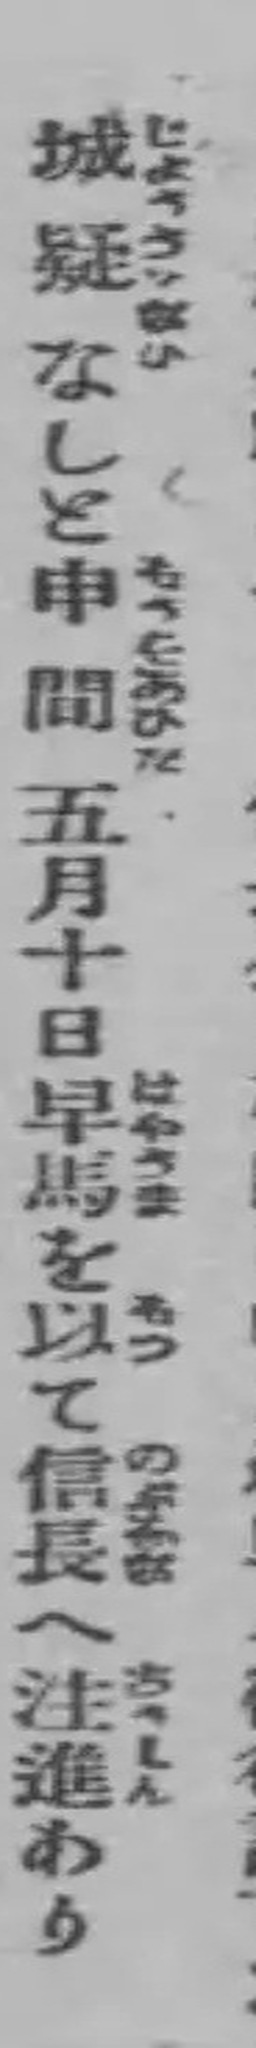城疑なしと申間五月十日早馬を以て信長へ注進あり
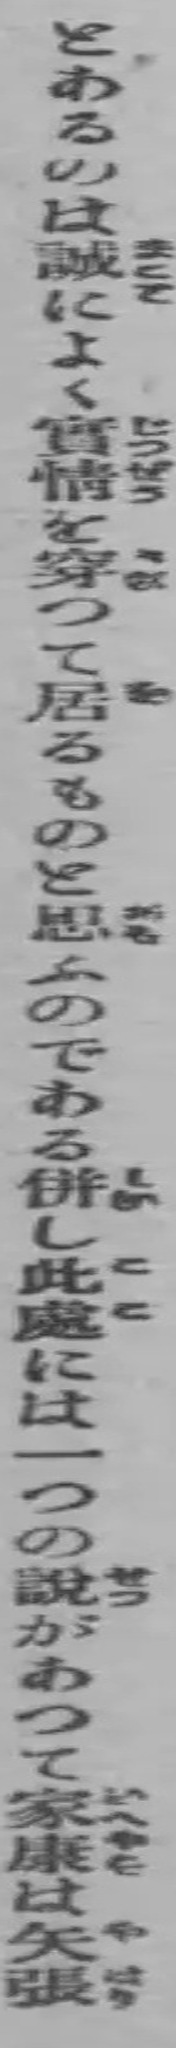とあるのは誠によく実情を穿つて居るものと思ふのである併し此処には一つの説があつて家康は矢張

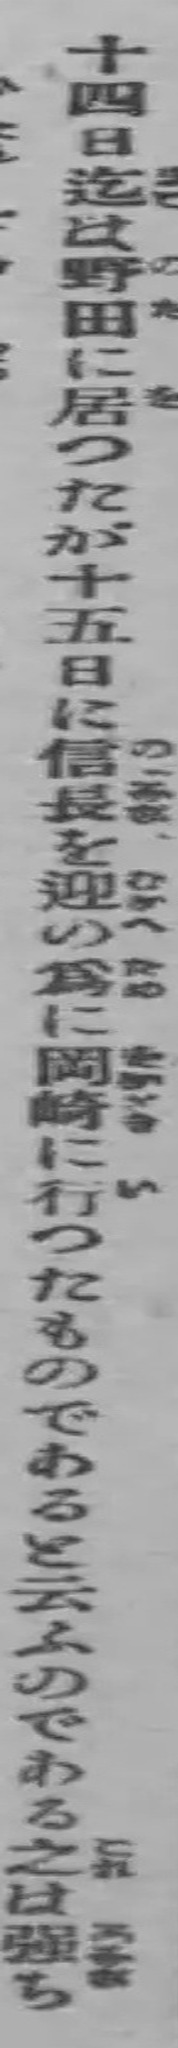十四日迄は野田に居つたが十五日に信長を迎の為に岡崎に行つたものであると云ふのである之は強ち
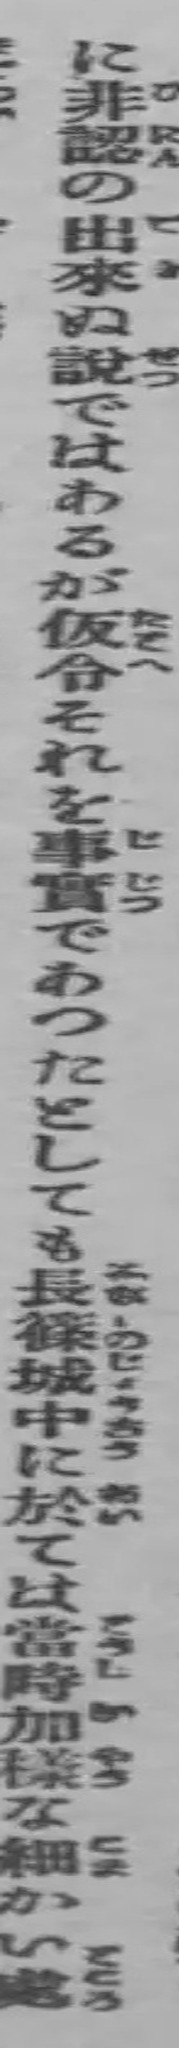に非認の出来ぬ説ではあるが仮令それを事実であつたとしても長篠城中に於ては当時加様な細かい処
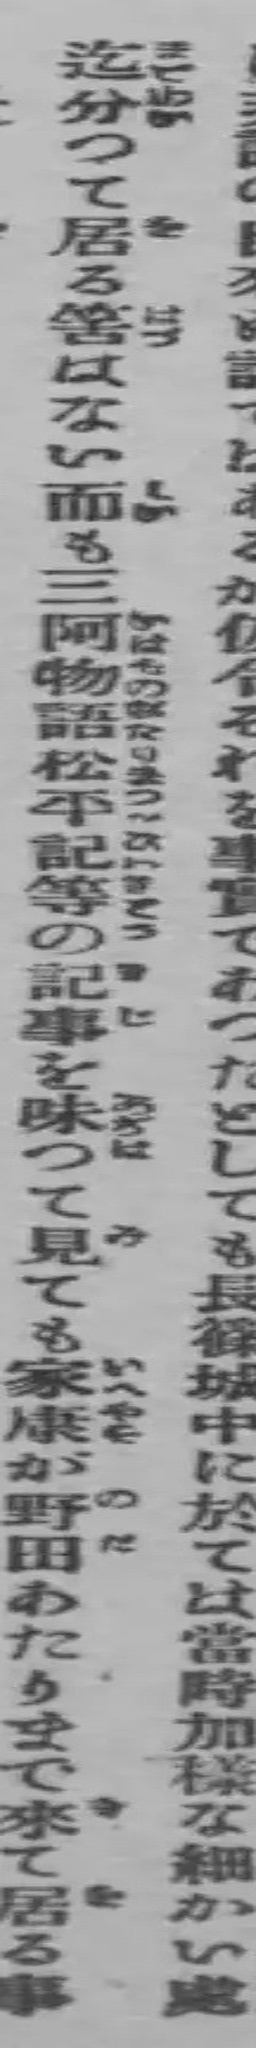迄分つて居る筈はない而も三河物語松平記等の記事を味つて見ても家康が野田あたりまで来て居る事
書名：豊橋市史談
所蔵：国立国会図書館 National Diet Library, JAPAN
